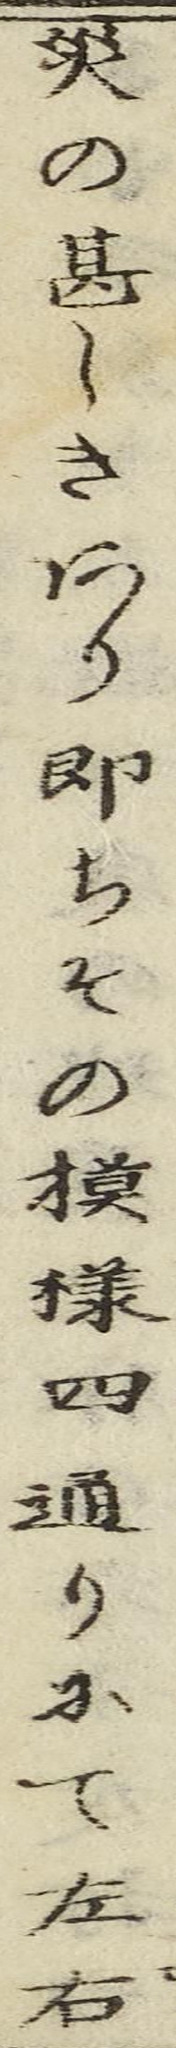災の甚しきあり即ちその模様四通りにて左右
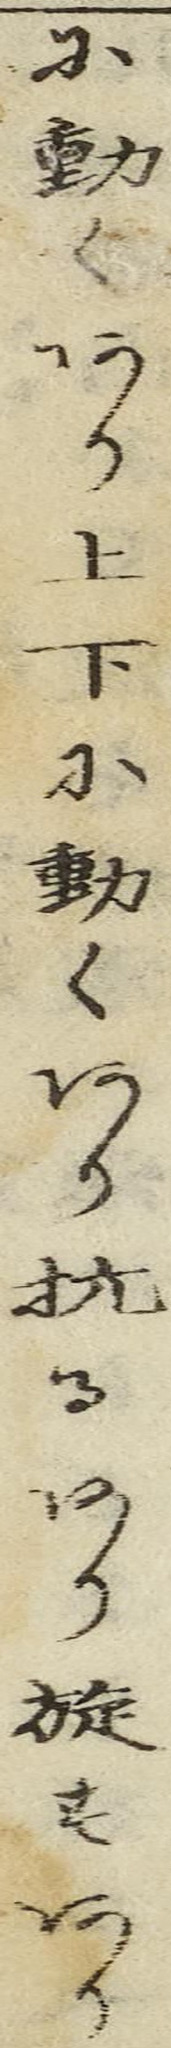に動くあり上下に動くあり抗るあり旋すあり

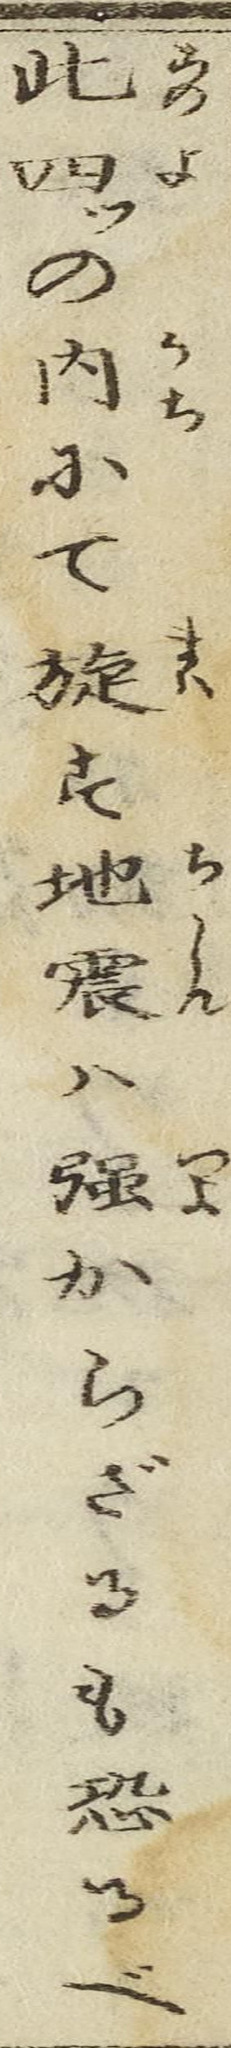此四ツの内にて旋す地震は強からざるも恐るべ
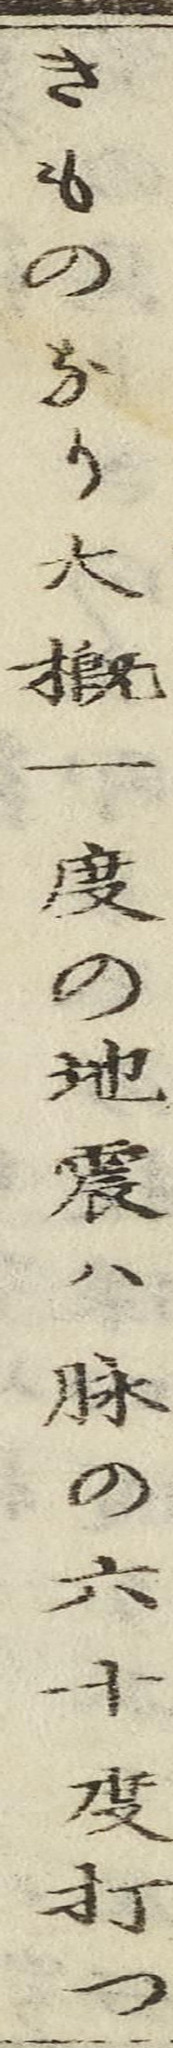きものなり大概一度の地震は脈の六十度打つ
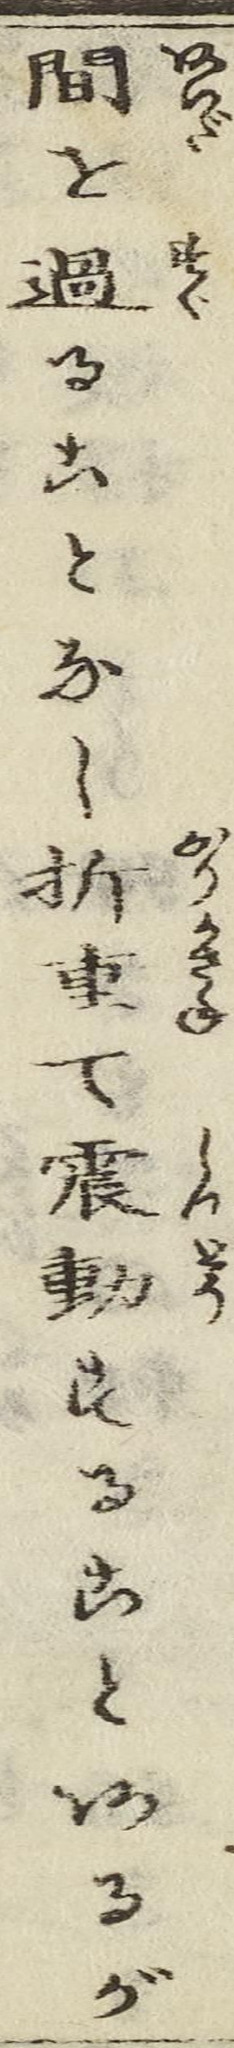間を過ることなし折重て震動することあるが
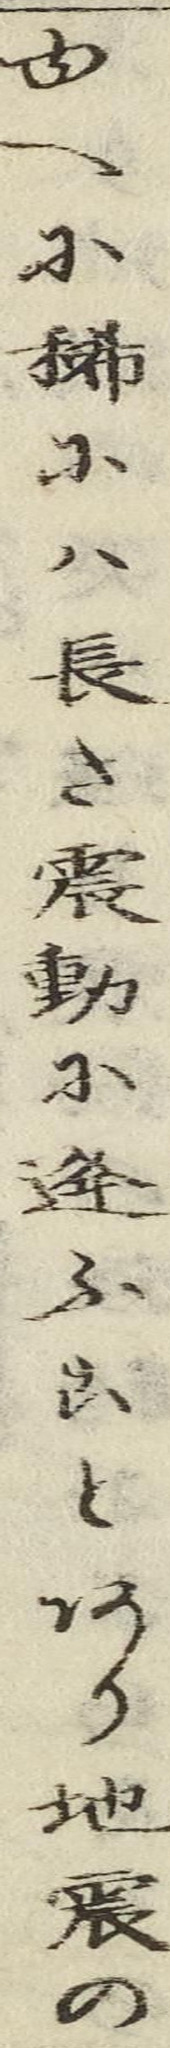ゆへに稀には長き震動に逢ふことあり地震の
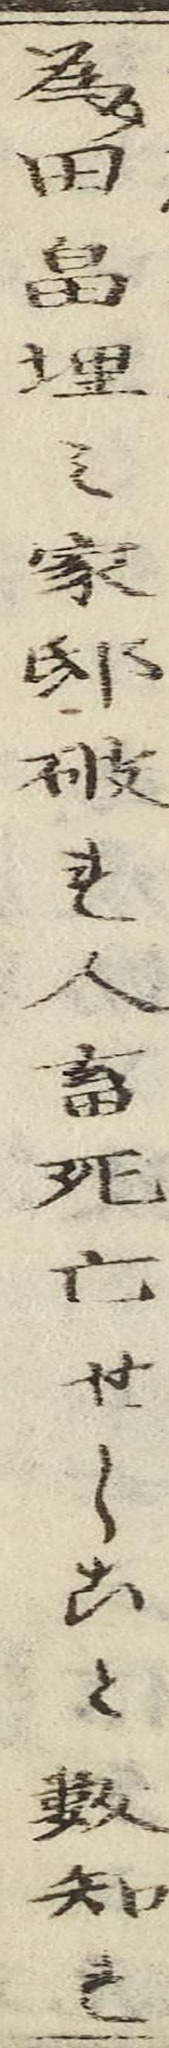為メ田畠埋み家邸破れ人畜死亡せしこと数知れ
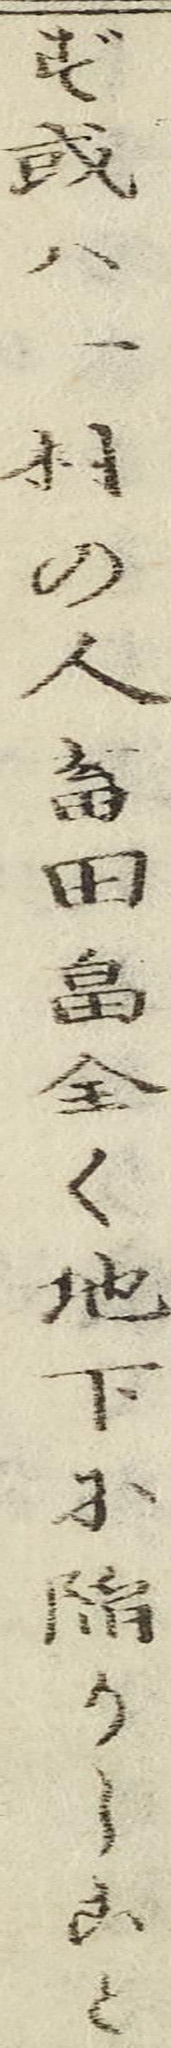ず或は一村の人畜田畠全く地下に陥りしこと
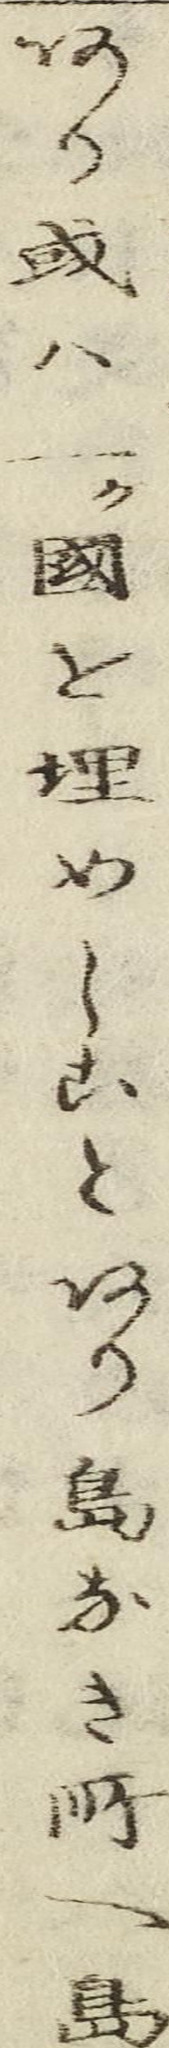あり或は一ヶ国を埋めしことあり島なき所へ島
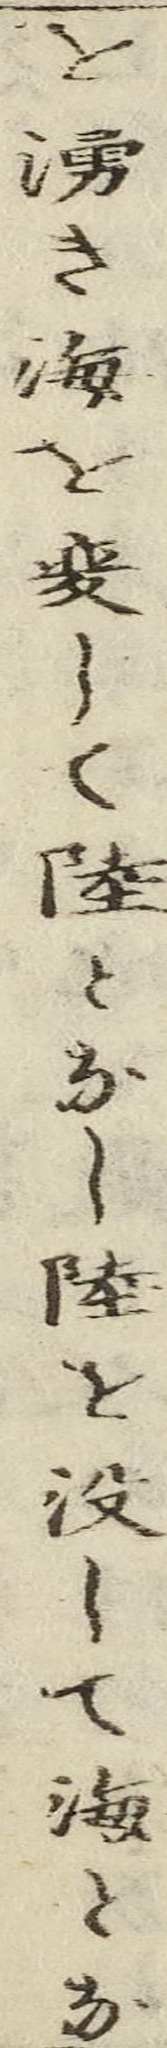を湧き海を変して陸となし陸を没して海とな
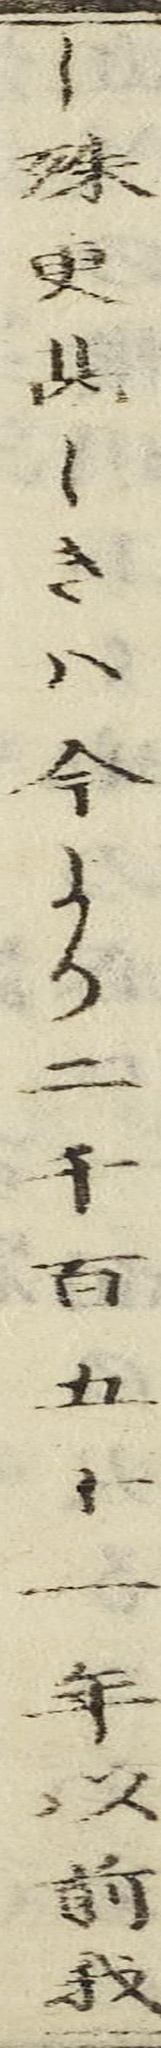し殊更甚しきは今より二千百五十一年以前我
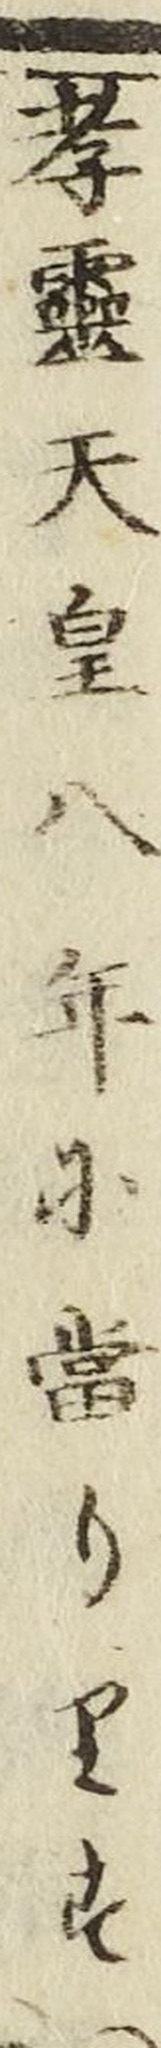孝霊天皇八年に当りりす
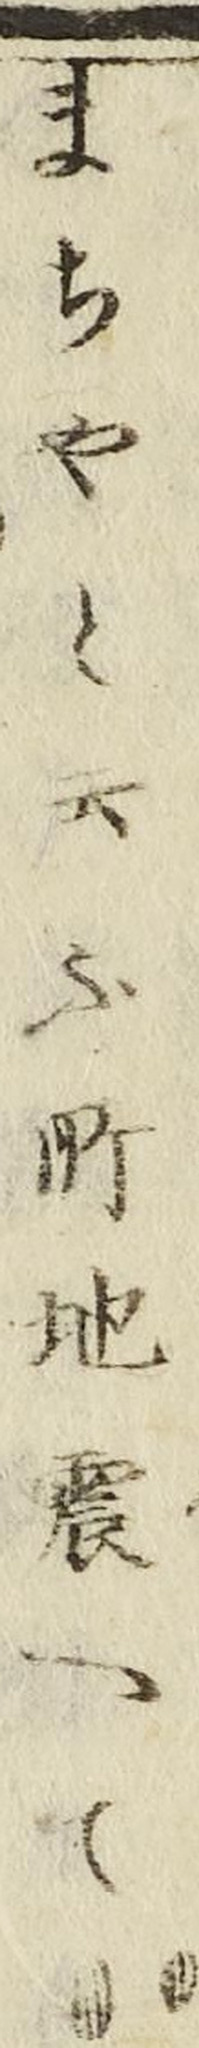まちやと云ふ所地震へて
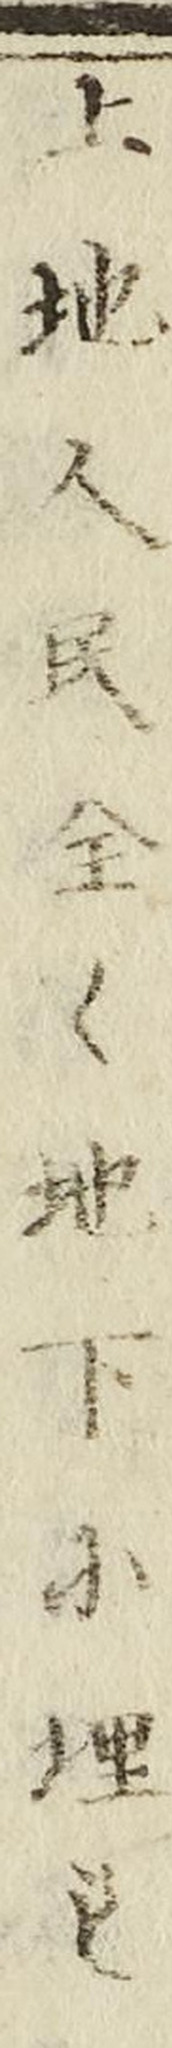土地人民全く地下に埋れ
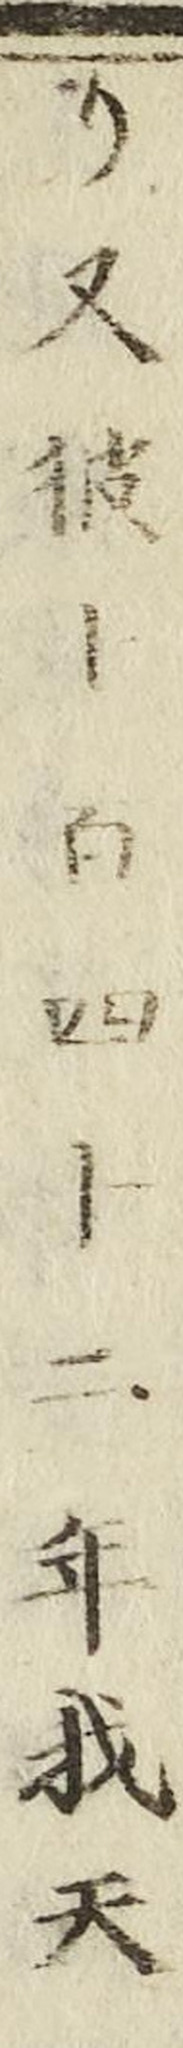り又彼七百四十二年我天
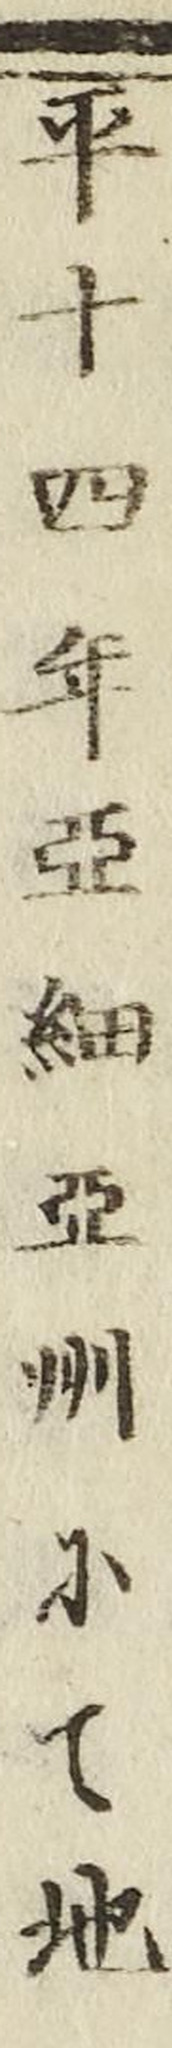平十四年亜細亜州にて地
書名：天変地異
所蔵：東京大学地震研究所図書室 Earthquake Research Institute Library, The University of Tokyo, JAPAN
